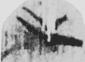之
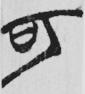可（何）
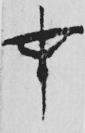才
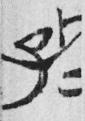孔子
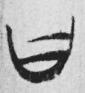曰
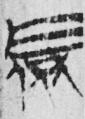○（庶）
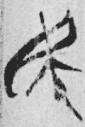民
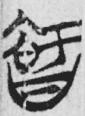智（知）
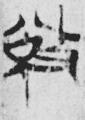敓（說）
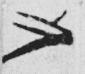之
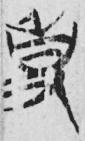事
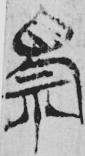○（鬼）
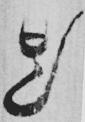也
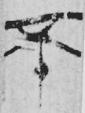不
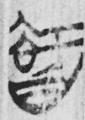智（知）
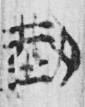型（刑）
